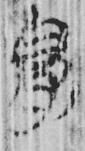胃（謂）
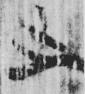之
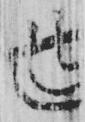必
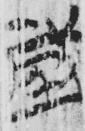城（成）
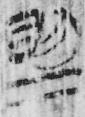則（則）
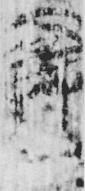○（暴）
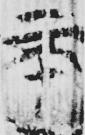不
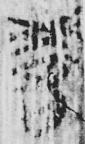○（教）
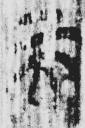而
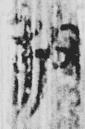殺
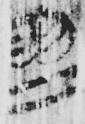則（則）
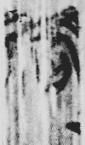○（虐）
